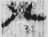八
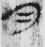月
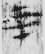辛
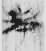未
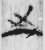之
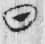日
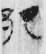○（鄖）
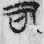司
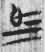馬
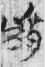豫
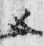之
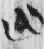州
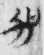加
